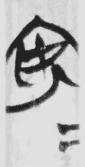安=
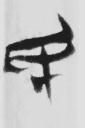民
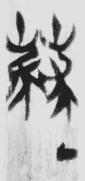{艸㣇聿}
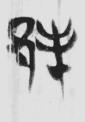邦
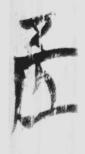危
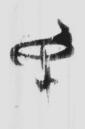民
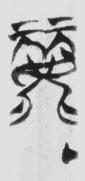麗
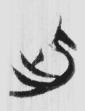此
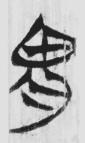胃
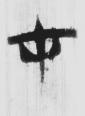才
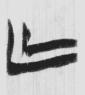亡
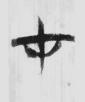才
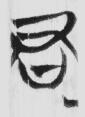君
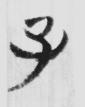子
